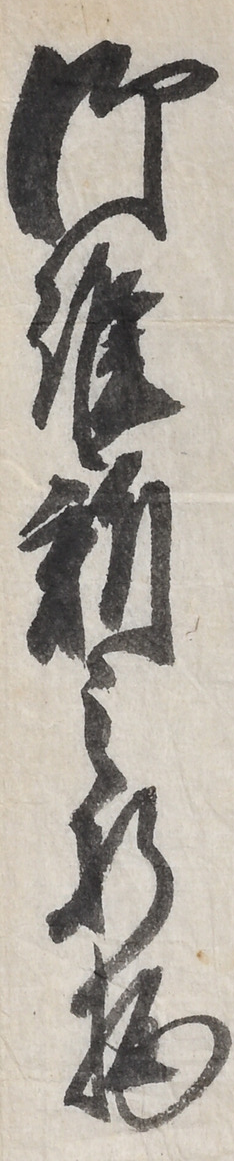御維新之折柄
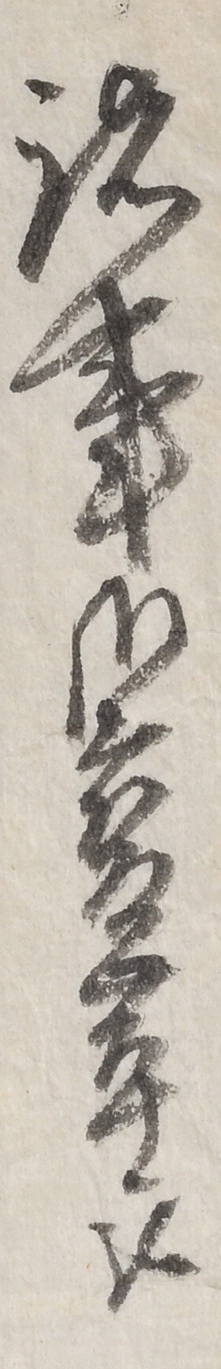諸事御変革被
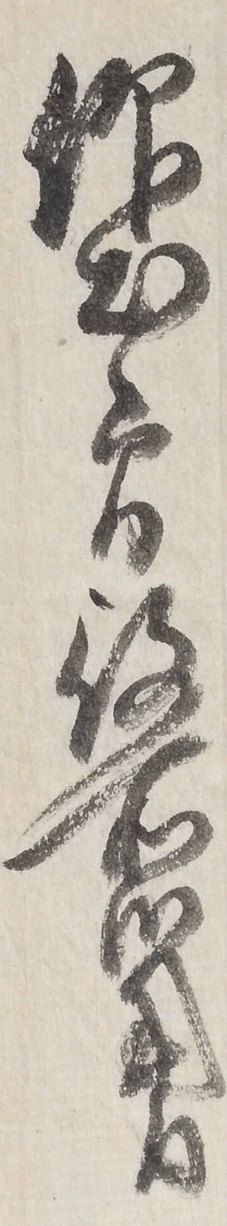仰出候間役所御用日
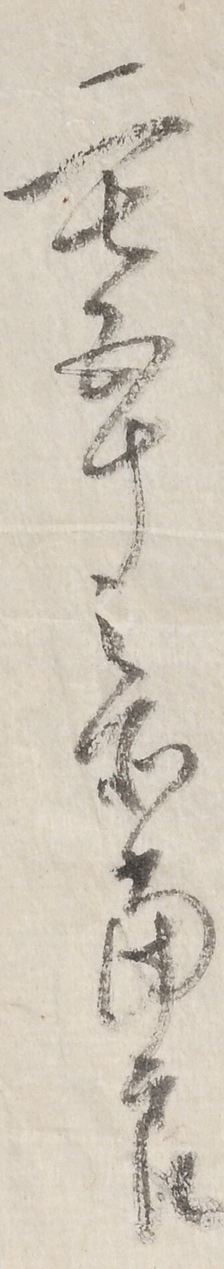二七五十之所当節
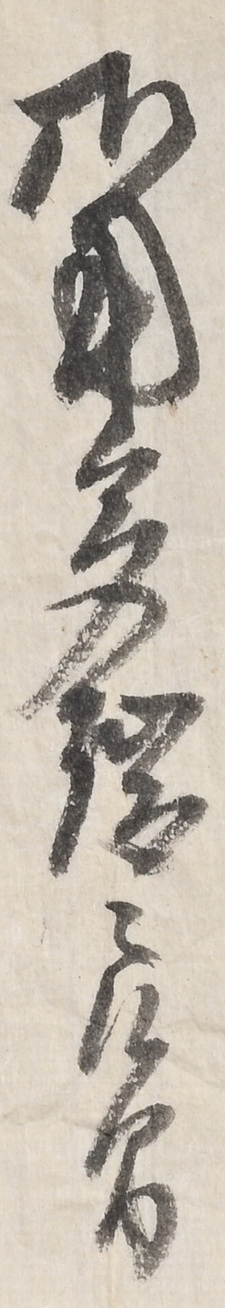御用多端ニ候間
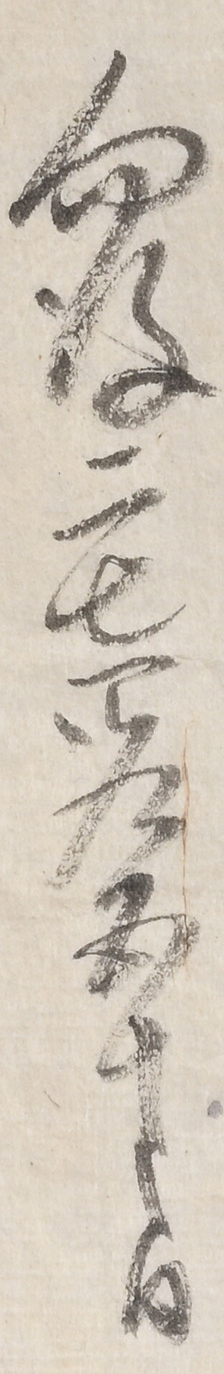向後二七四九五十之日
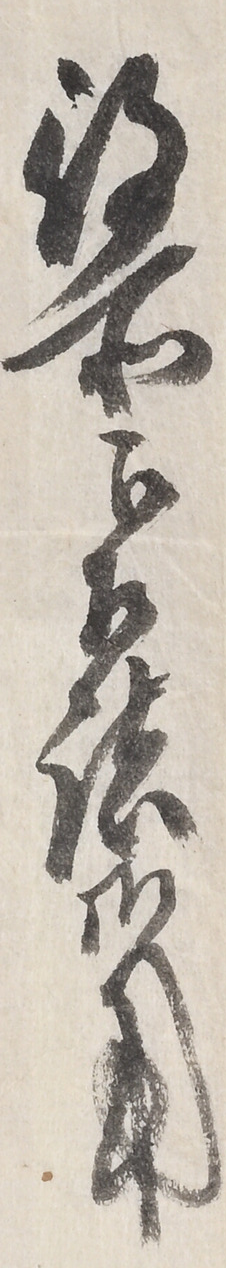役所江相詰御用
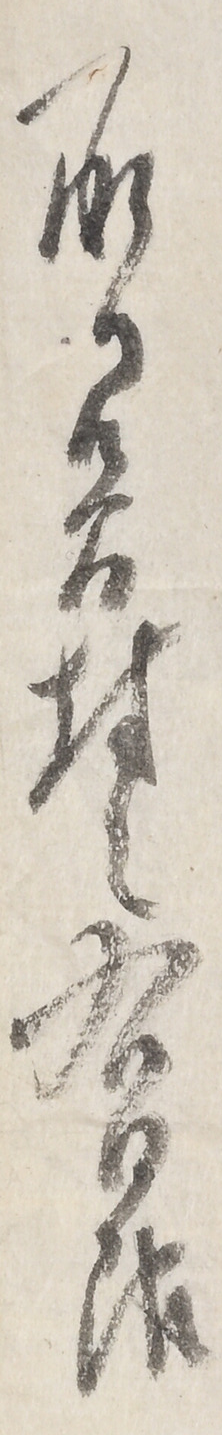承り候間村々右日限
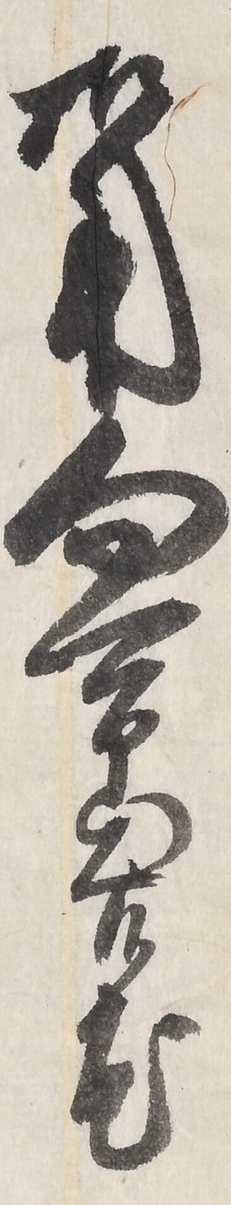御用向可申出候尤
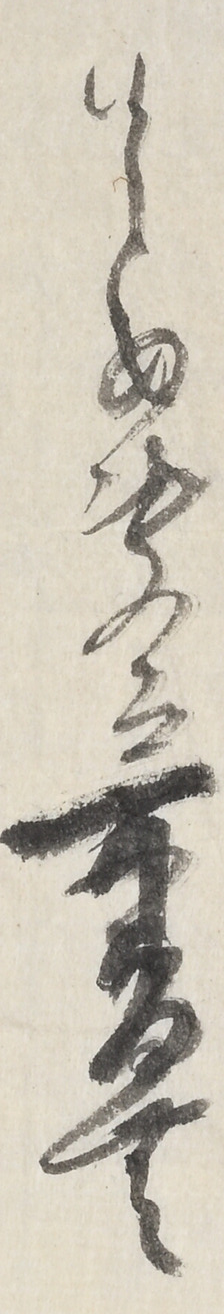候之義決而可為無
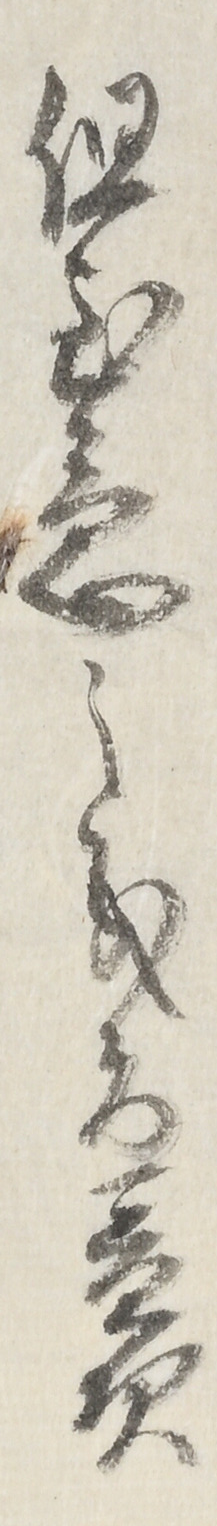但至急之義ニハ昼夜
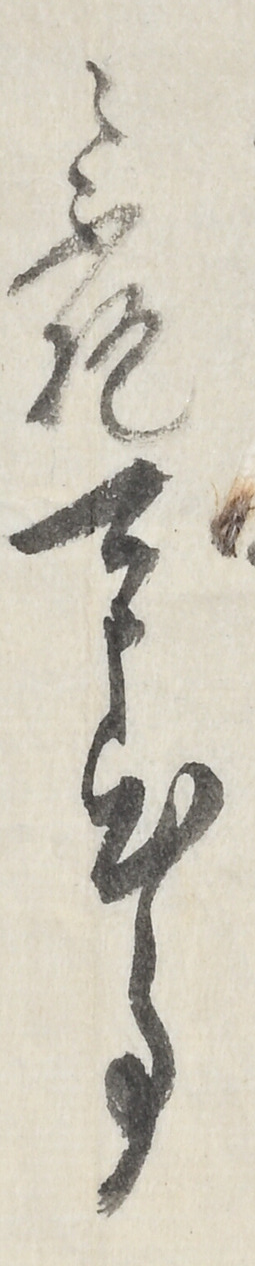ニ不拘可申出事
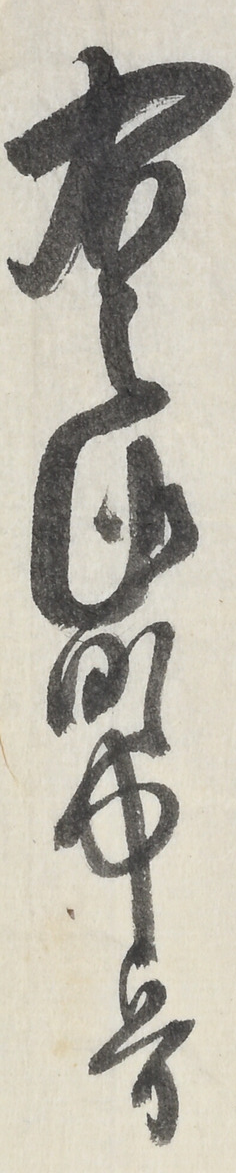右之趣町中廻り
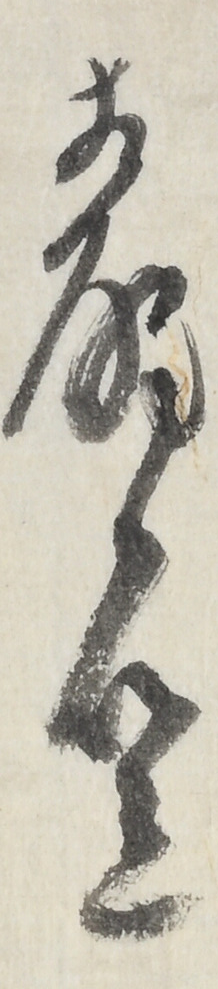相触候以上
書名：（書付）
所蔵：伊那市立高遠町図書館・合同会社AMANE
